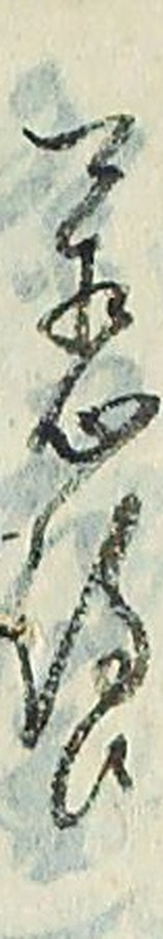可相心得候
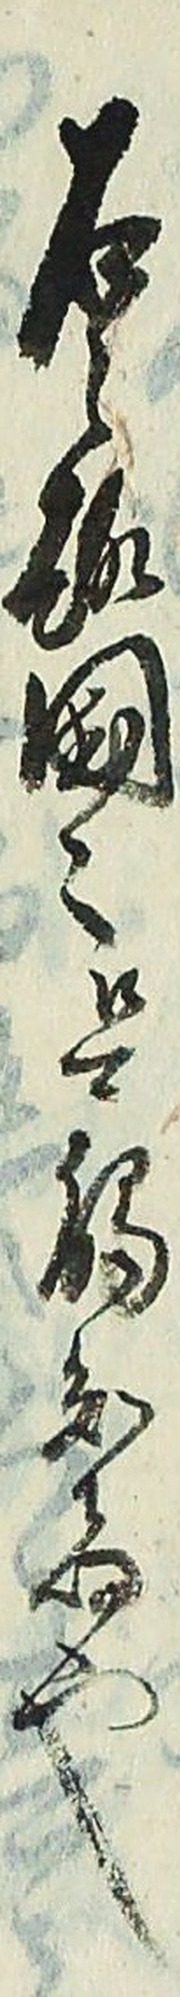右之趣国々江可触知者也
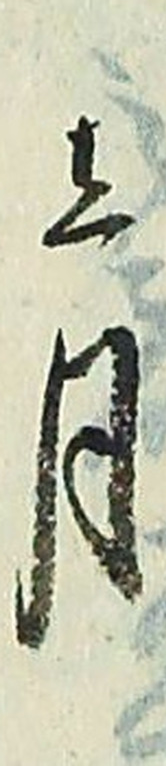十一月
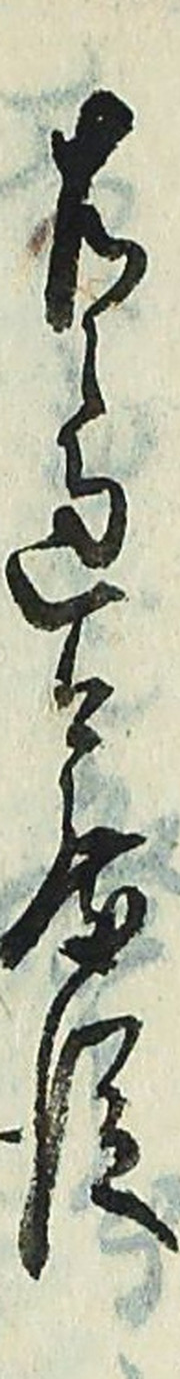右之通今度従
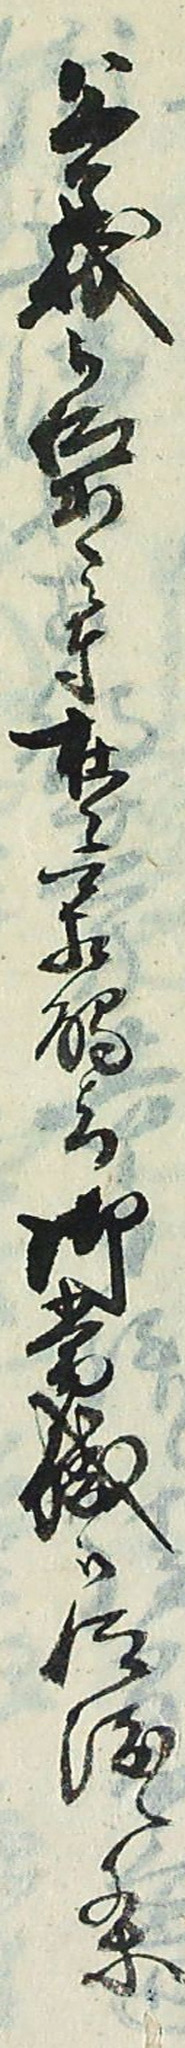公義被仰出候に付在々可相触旨御当職被仰渡候条
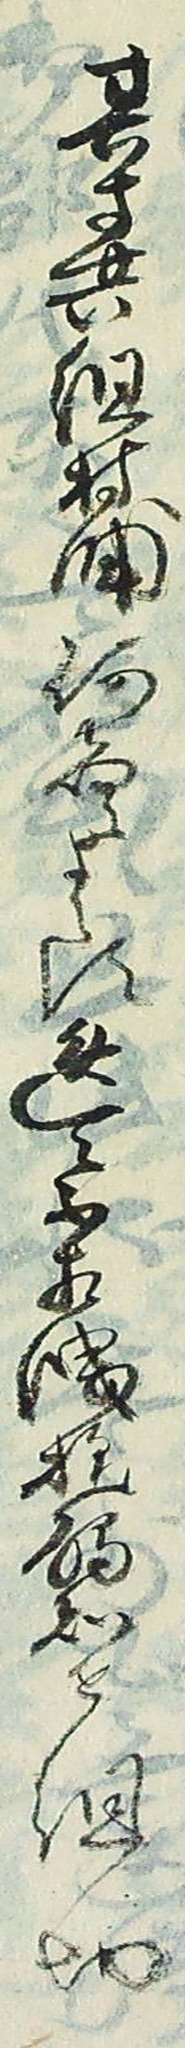其方共組村浦何者によらす逸々不相洩様触知せ組切
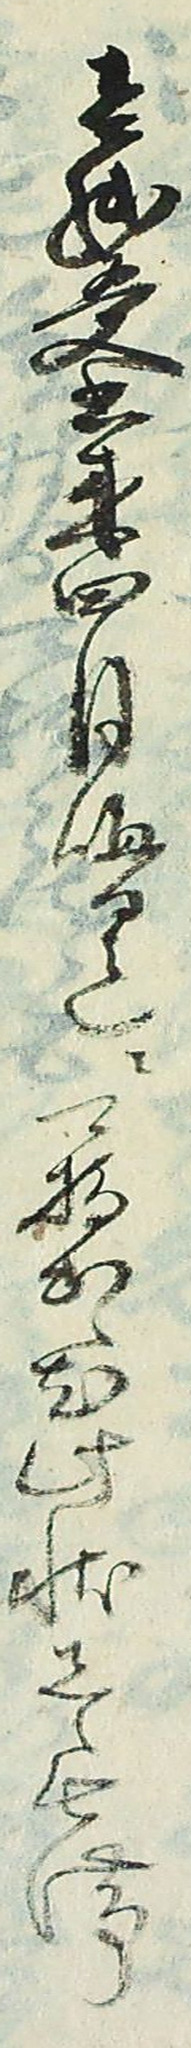壱紙受書来四月晦日迄に可指出候尤此状先々無滞
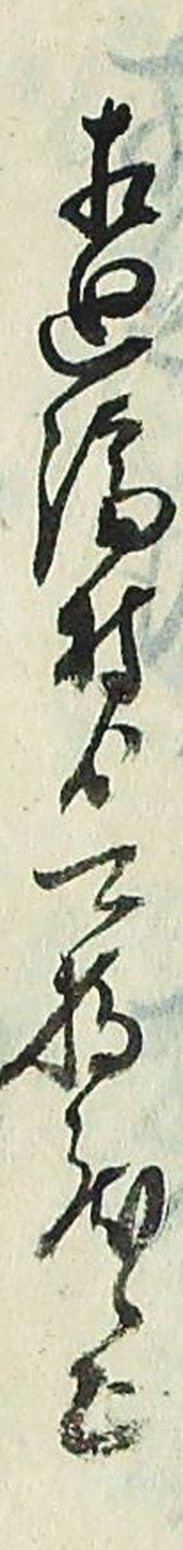相廻済村ゟ可指戻候以上
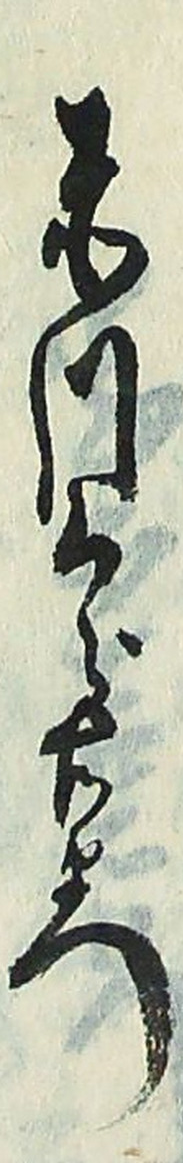末川三郎右衛門
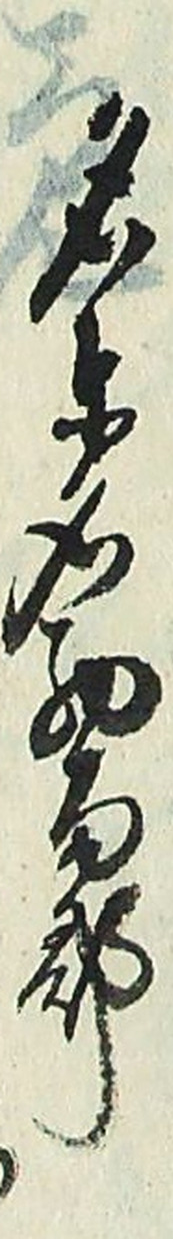名東名西両郡
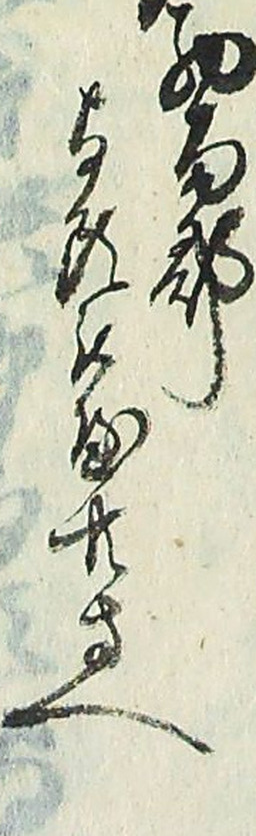与頭庄屋共方へ

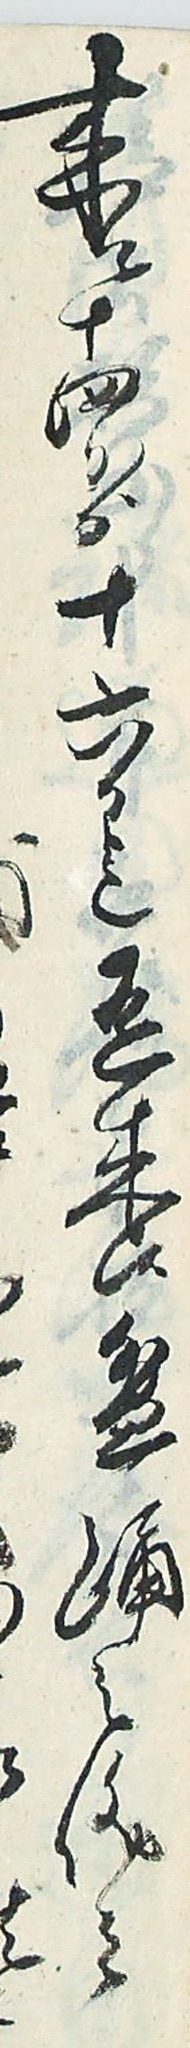来る十四日ゟ十六日迄有来候盆踊之儀は
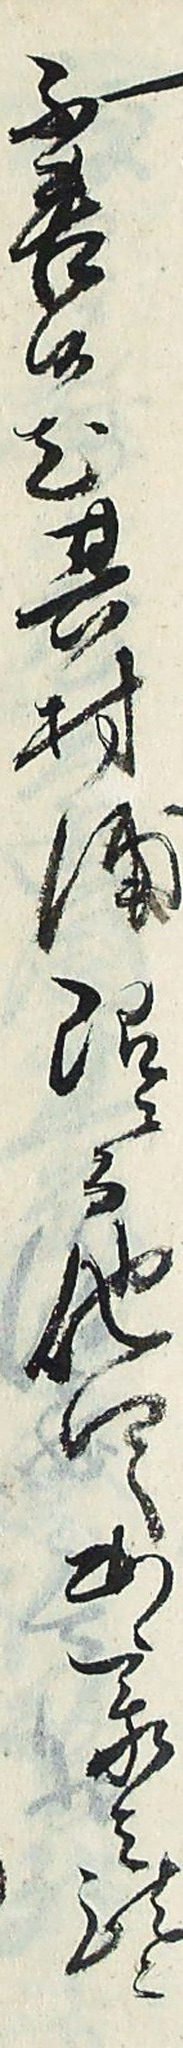不苦候尤其村浦限に而他郷へ出候義は屹と
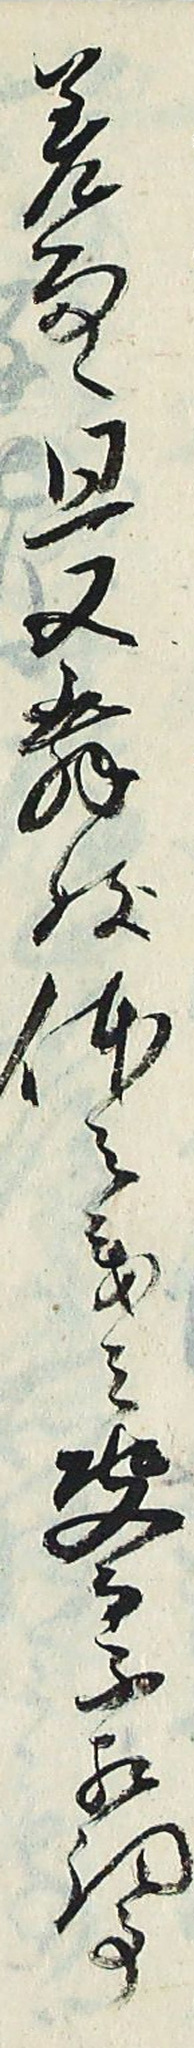差留候且又舞妓体之義は決而不相調事
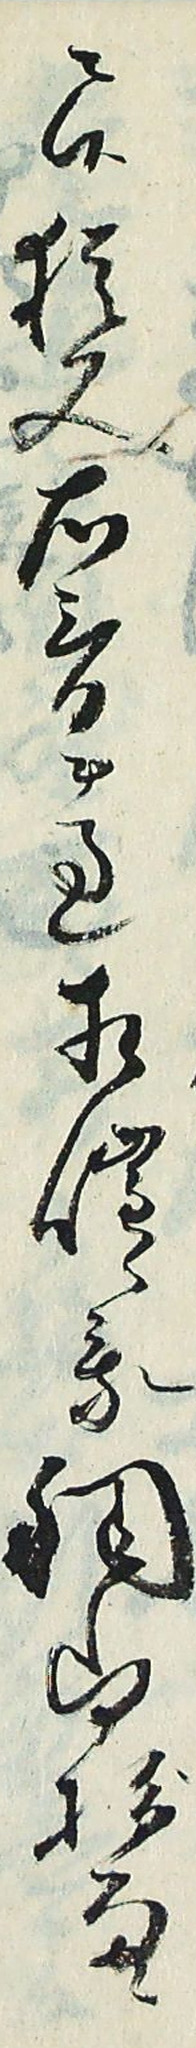に候猶又右三日を過相催候義稠布指留候
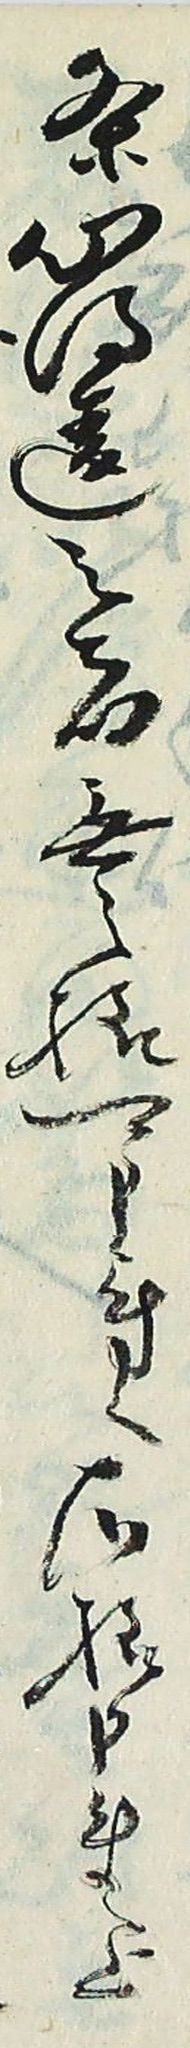条心得違之者無之様可申付候右様申付候上
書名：諸御用御□受書控
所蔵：鳴門教育大学 Naruto University of Education
